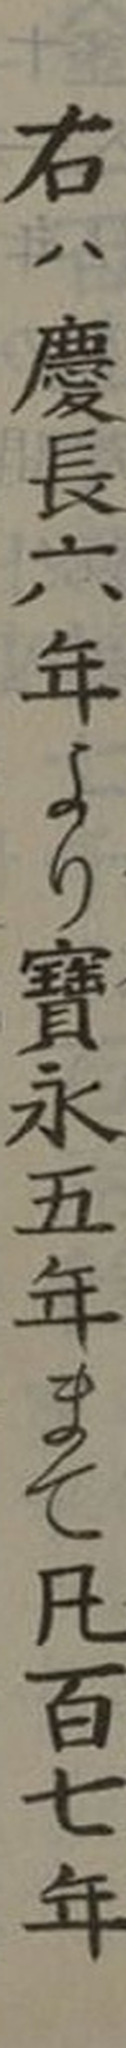右は慶長六年より寶永五年まて凡百七年
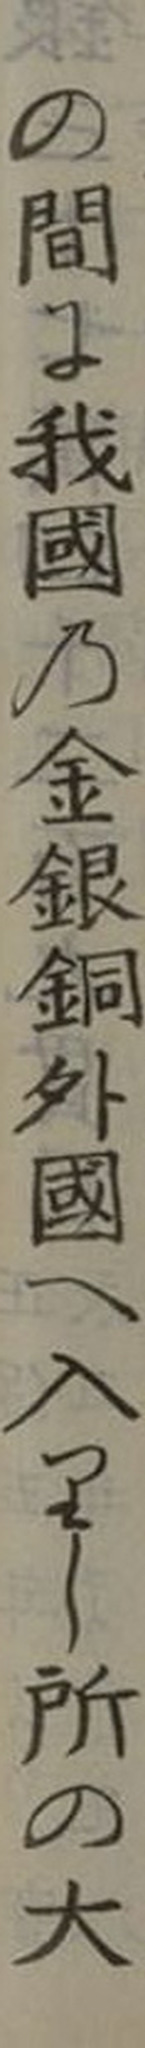の間に我國の金銀銅外國へ入りし所の大
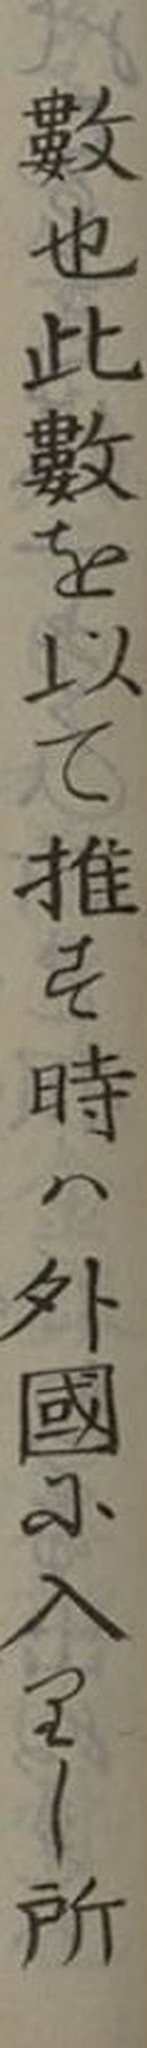數也比較を以て推す時は外國に入りし所
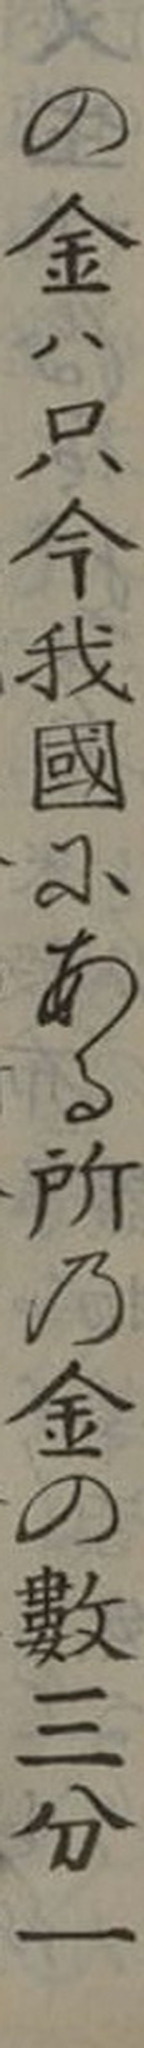の金は只今我國にある所の金の數三分一
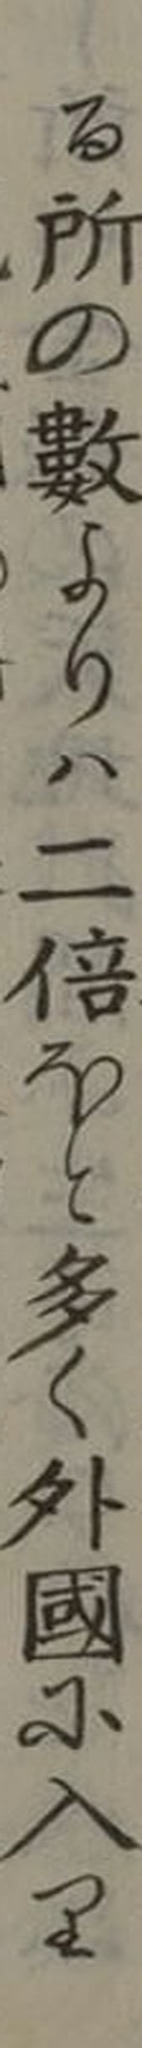る所の數よりは二倍ほと多く外國に入り
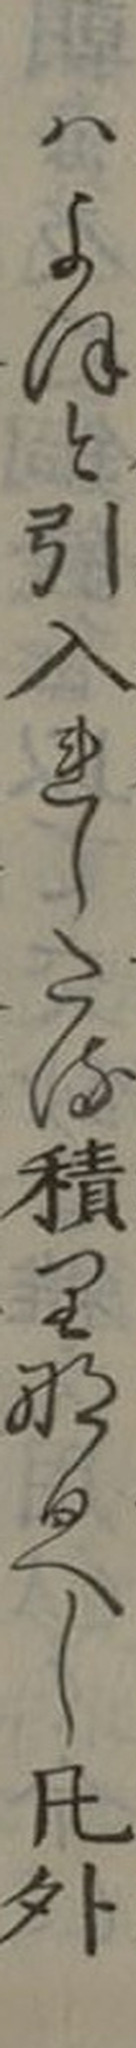はよほと引入れしたる積りなるへしとも外
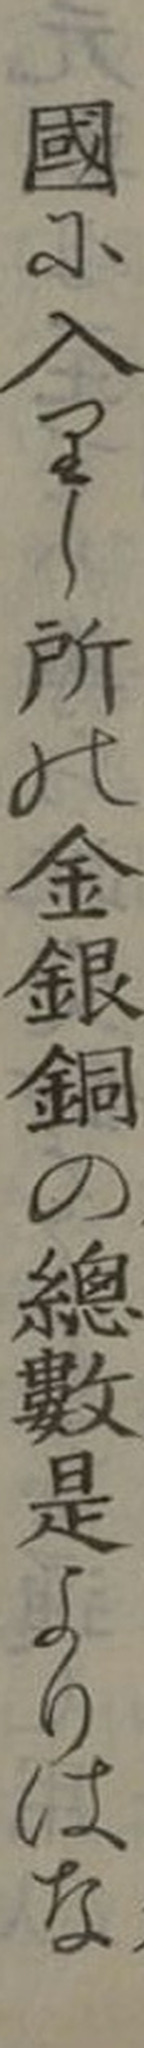國に入りし所の金銀銅の總數是よりはな
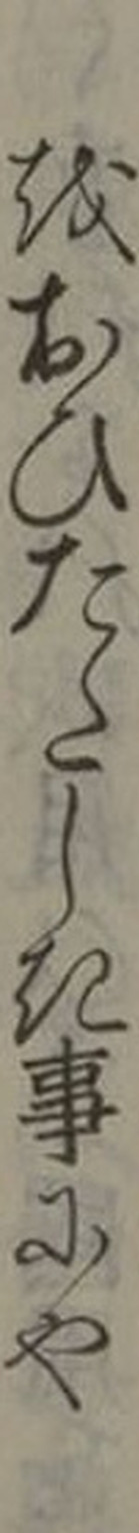をおひたたしき事にや
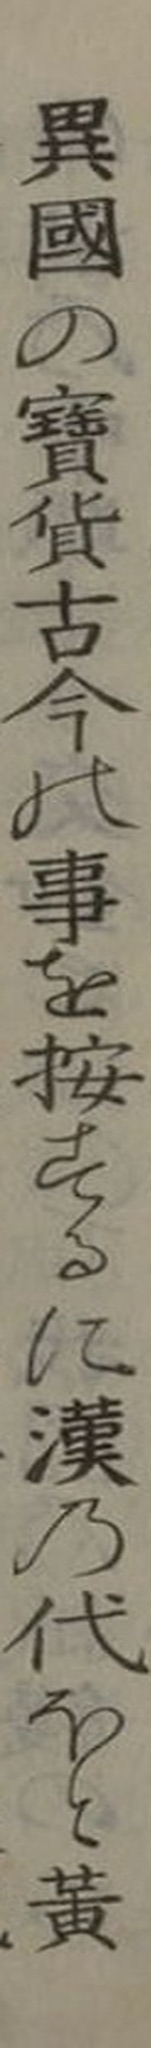異國の實貨古今の事を按するに漢の代ほと黄
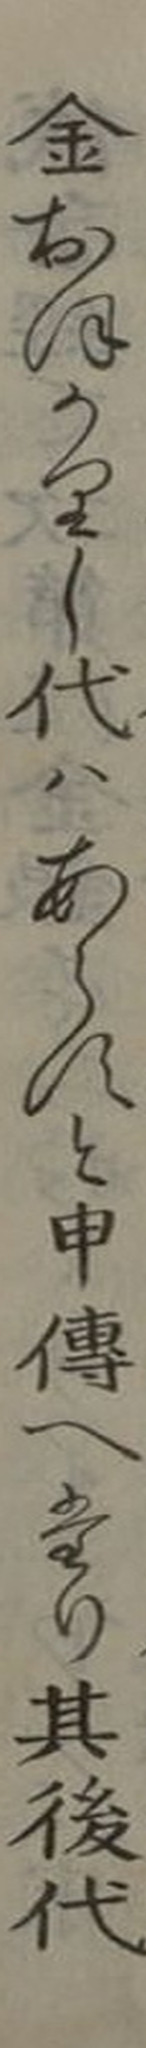金おほかりし代はあらすと申傳へたり其後代

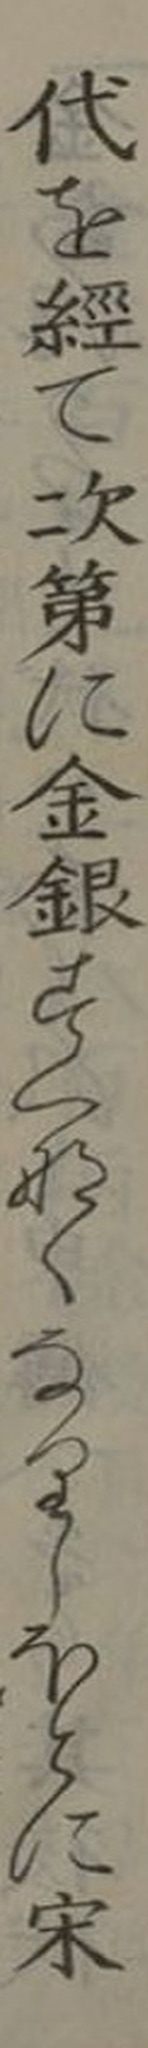代を經て次第に金銀すくなくなりしほとに宋
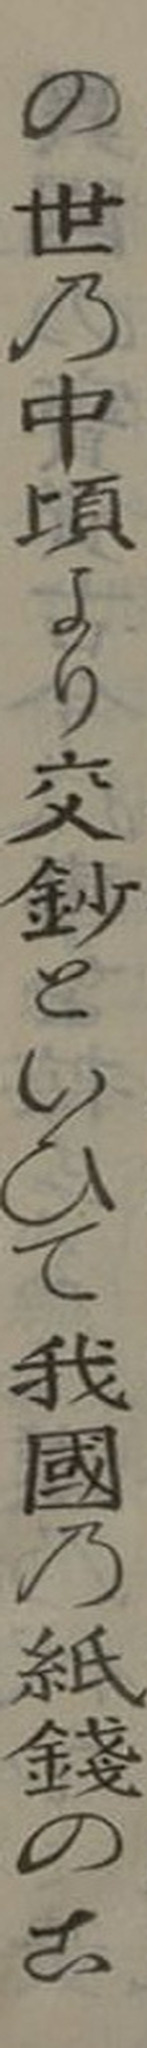の世の中頃より交鈔といひて我國の紙錢のこ
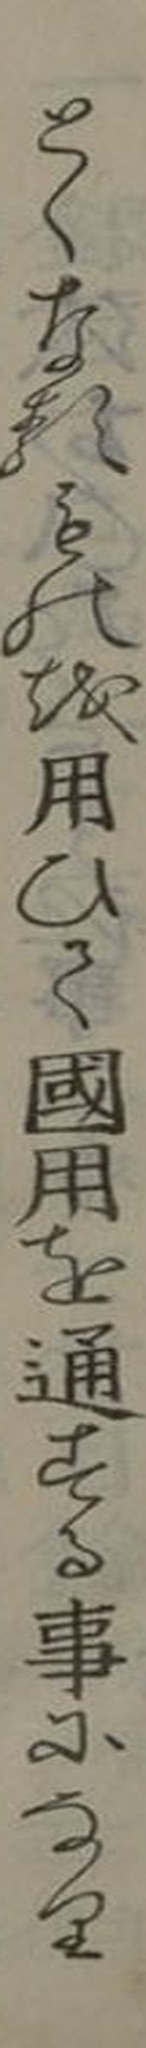とくなるものを用ひて國用を通する事になり
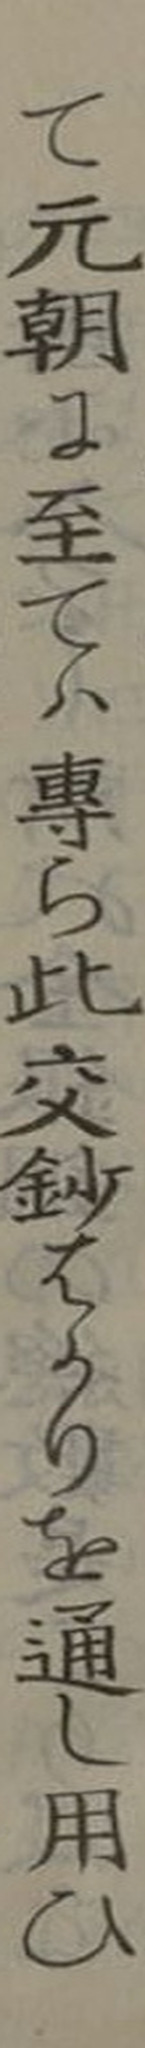て元朝に至ては專ら此交鈔はかりを通し用ひ
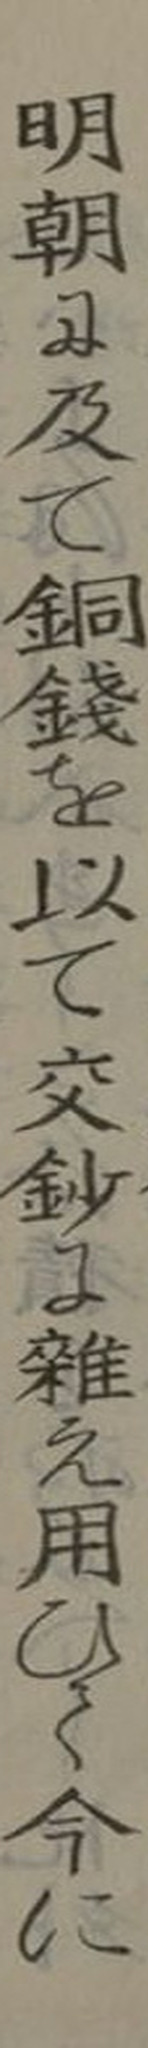明朝に及て銅錢を以て交鈔に雜え用ひて今に
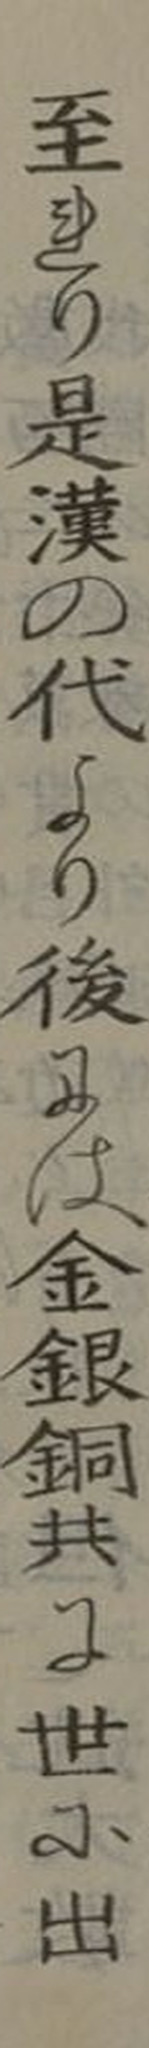至れり是漢の代より後には金銀銅共に世に出
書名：骨董録
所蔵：University of the Ryukyus Library
